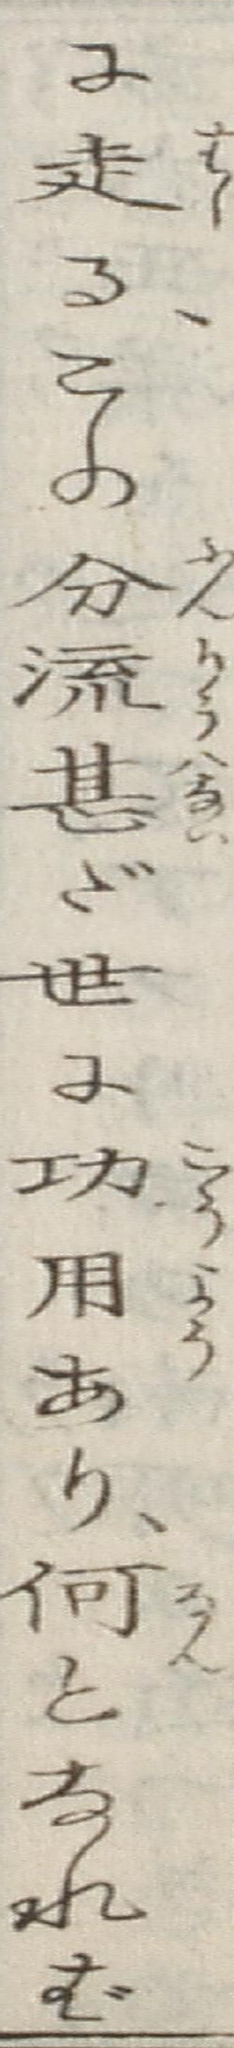に走る、この分流甚だ世に功用あり、何となれば
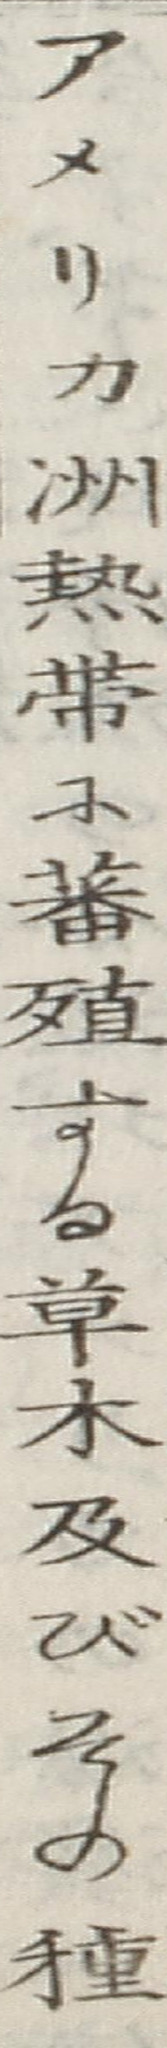アメリカ洲熱帯に蕃殖する草木及びその種
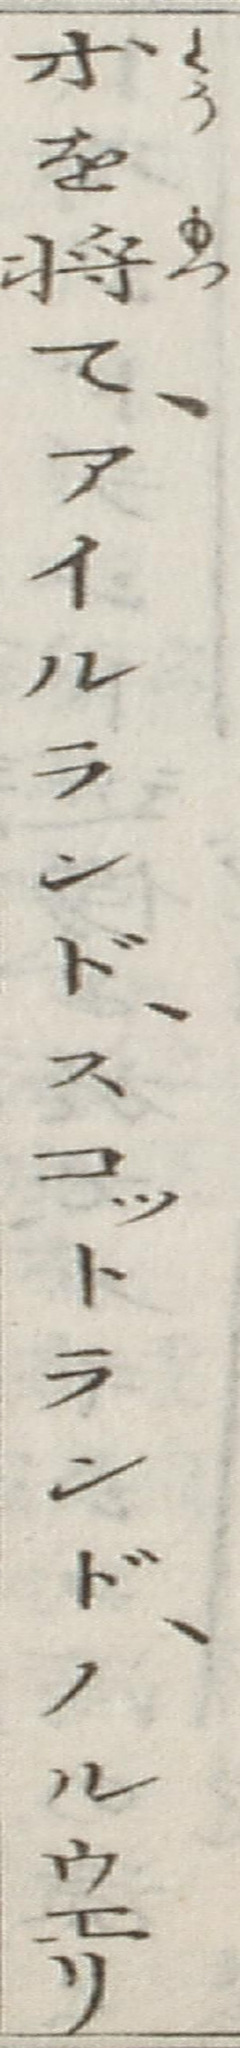等を将て、アイルランド、スコットランド、ノルウエリ
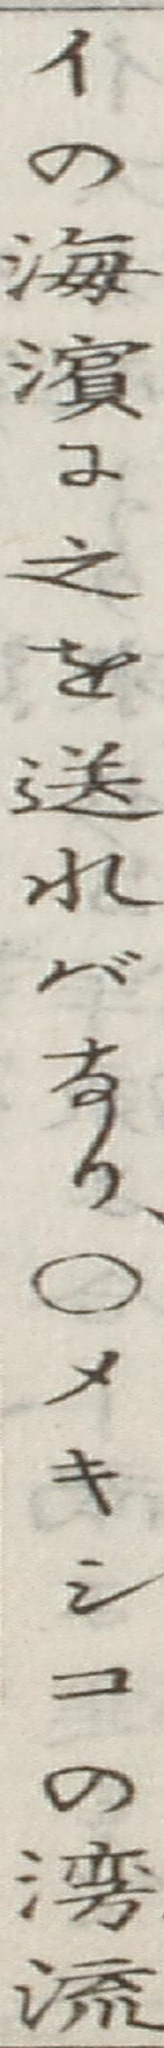イの海浜に之を送ればなり、○メキシコの湾流
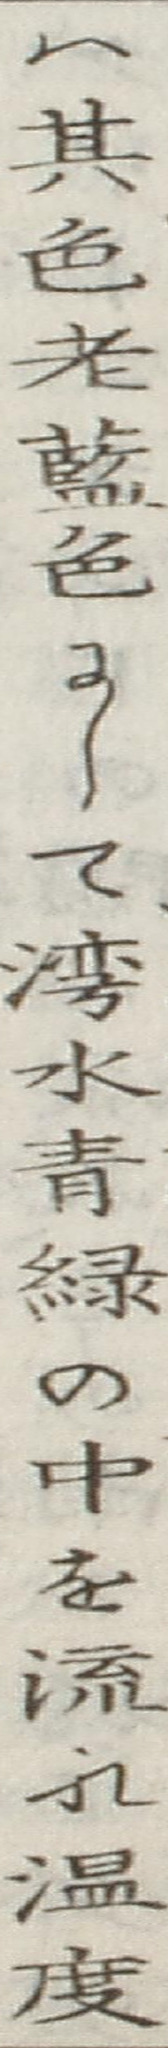は其色老藍色にして、湾水青緑の中を流れ、温度
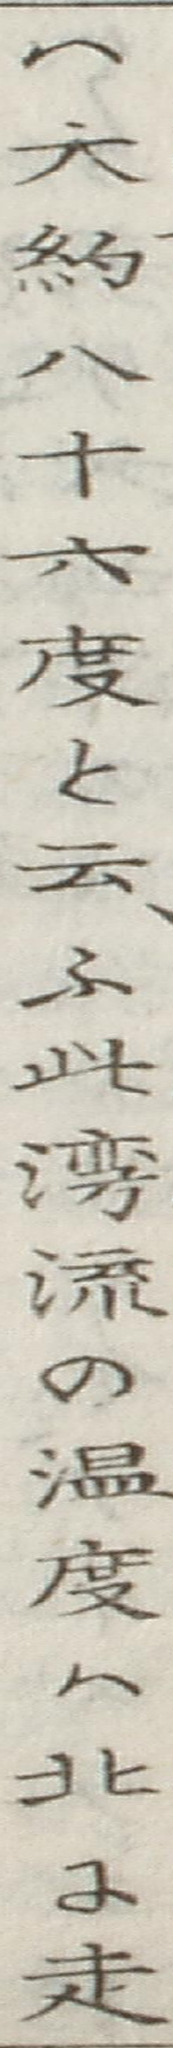は大約八十六度と云ふ、此湾流の温度は、北に走
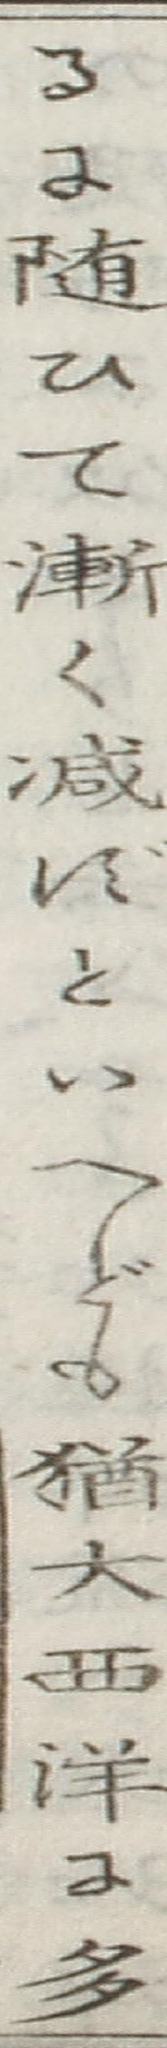るに随ひて漸く減ずといへども、猶大西洋に多
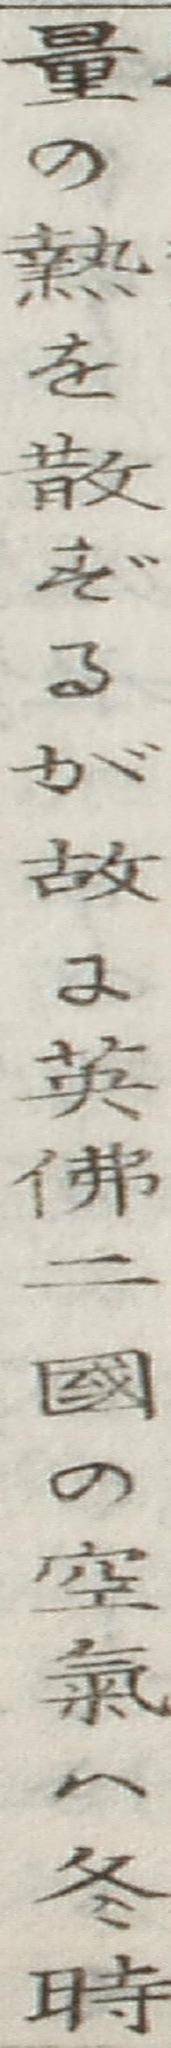量の熱を散ずるが故に、英仏二国の空気は、冬時
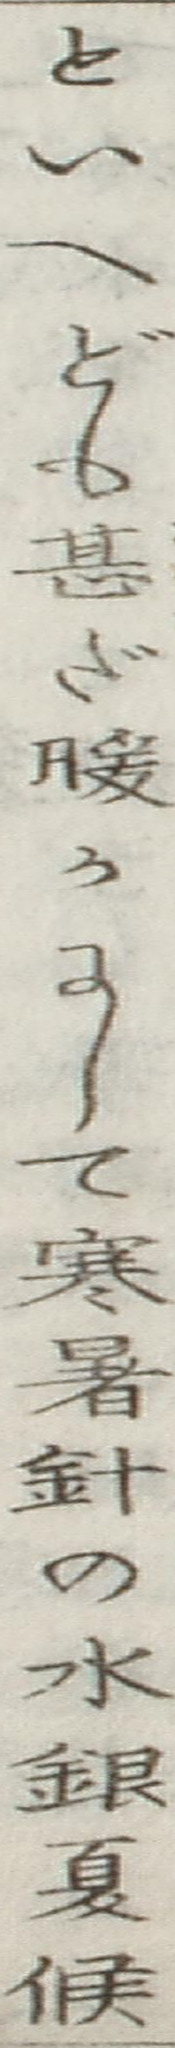といへども甚だ暖かにして、寒暑針の水銀夏候
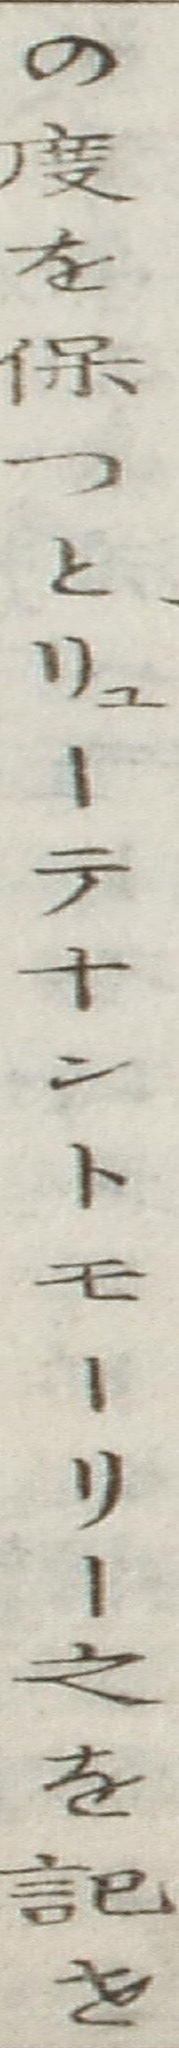の度を保つと、リューテナントモーリー之を記せ

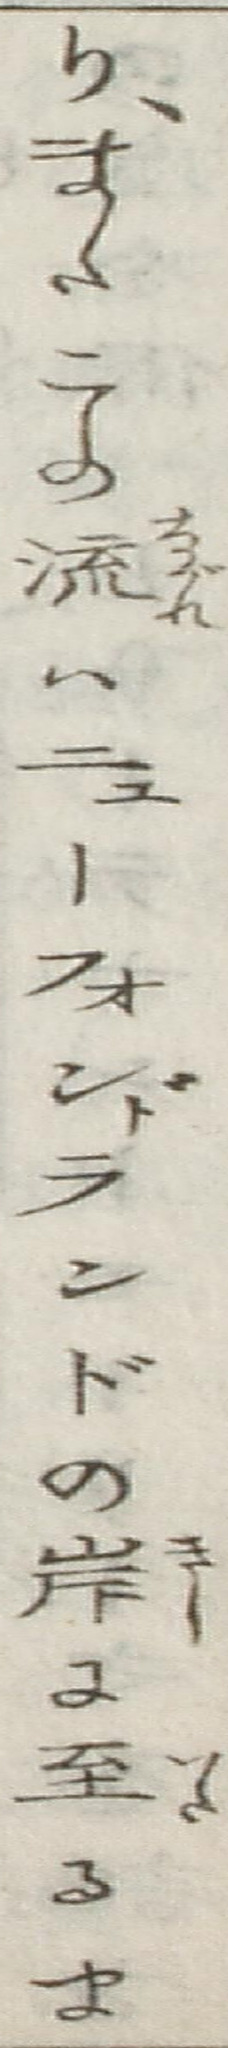り、またこの流はニューフォンドランドの岸に至るま
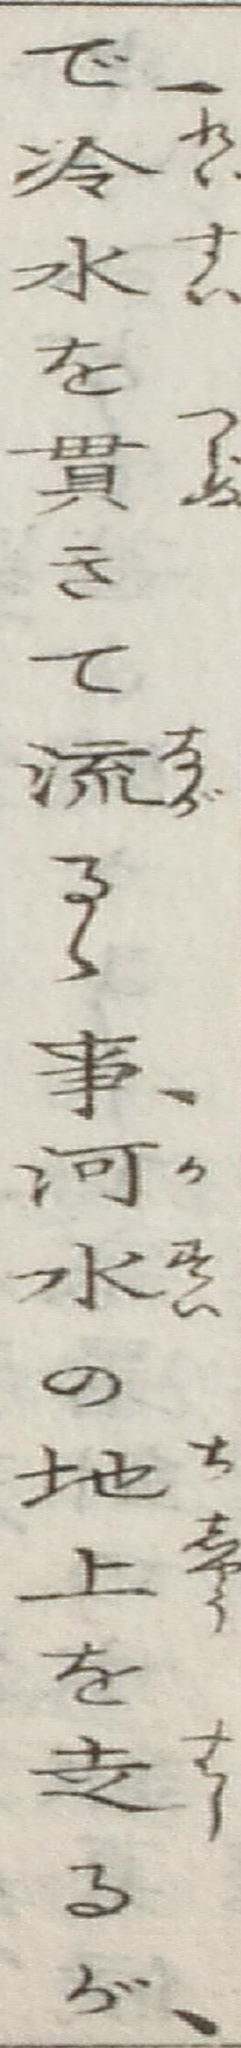で、冷水を貫きて流るゝ事、河水の地上を走るが、
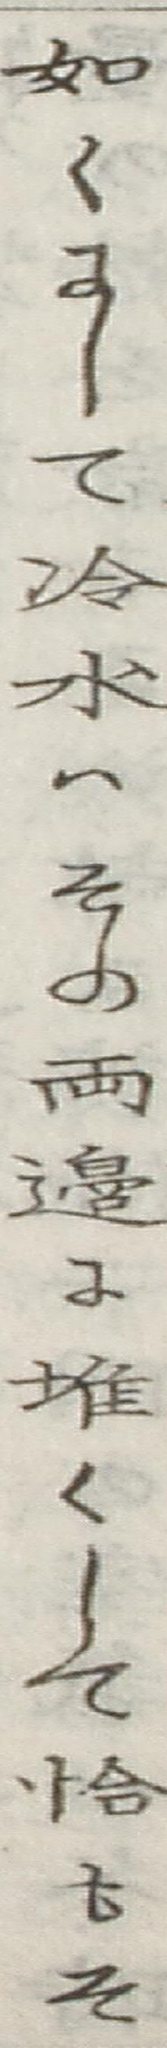如くにして、冷水はその両辺に堆くして、恰もそ
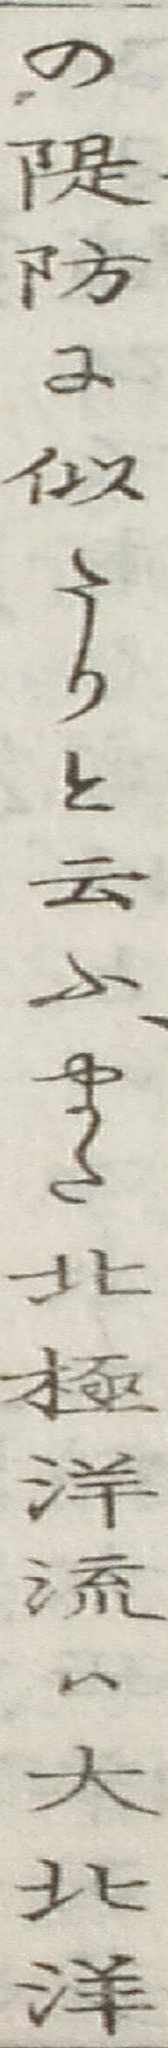の堤防に似たりと云ふ、また北極洋流は大北洋
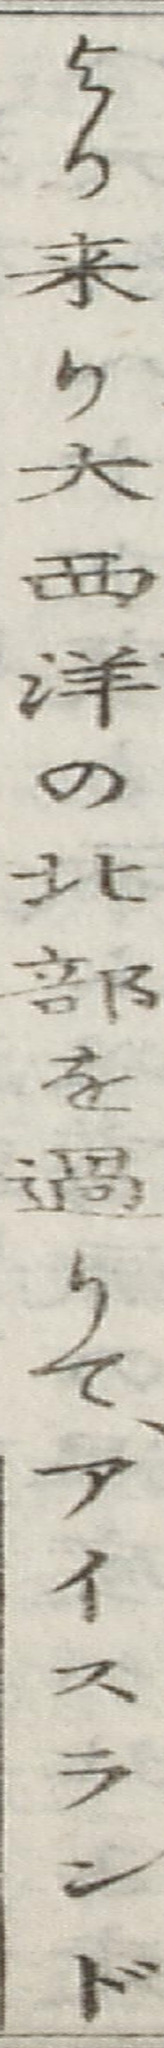より来り、大西洋の北部を過りて、アイスランド
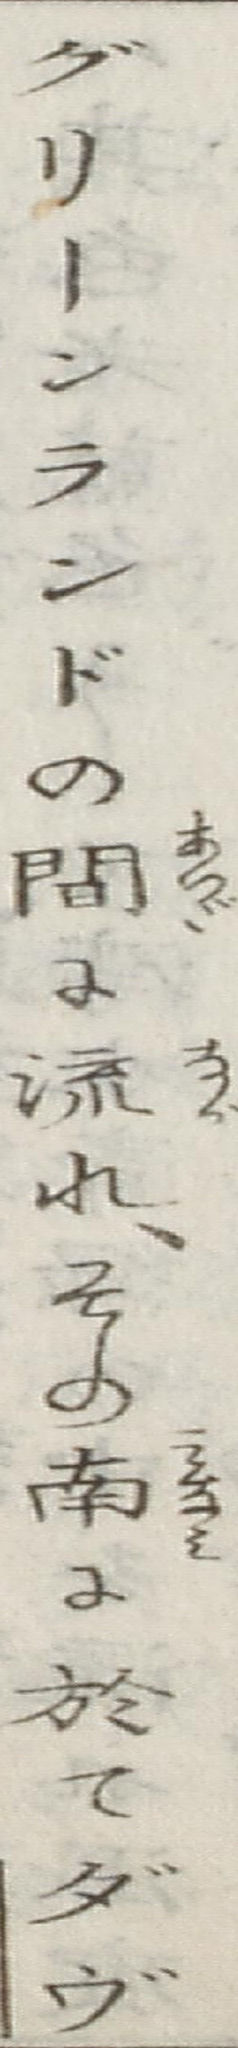グリーンランドの間に流れ、その南に於てダヴ
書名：訓蒙　天然地理學　中
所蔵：東京大学地震研究所図書室 Earthquake Research Institute Library, The University of Tokyo, JAPAN
